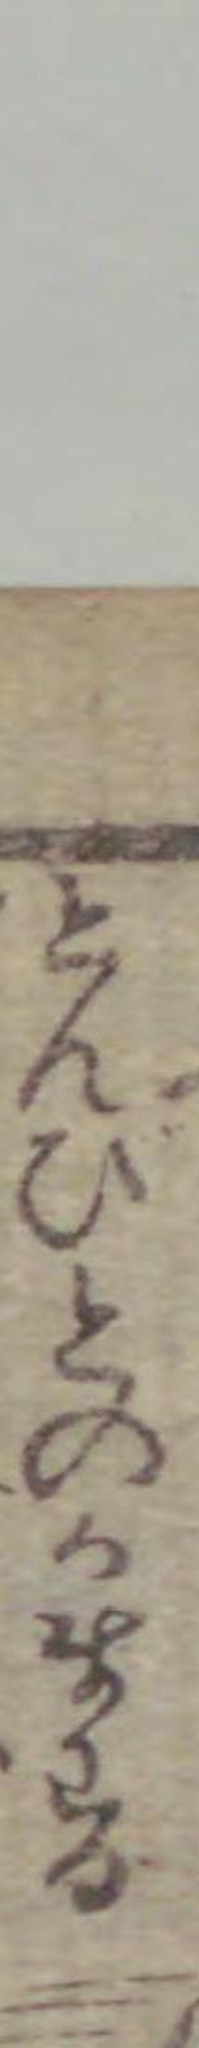とんびとのかまわる
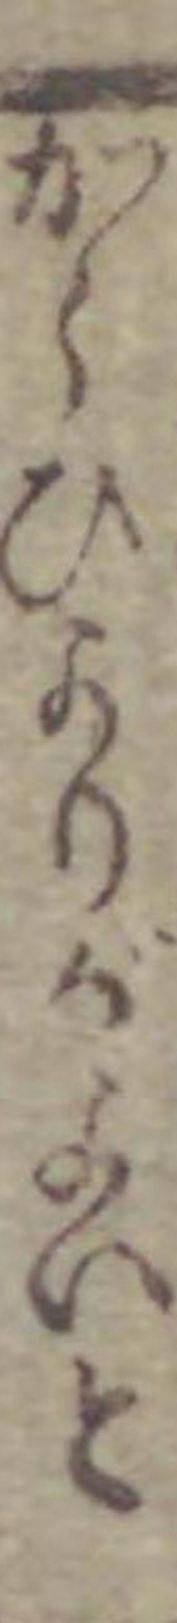からひよりがよいと
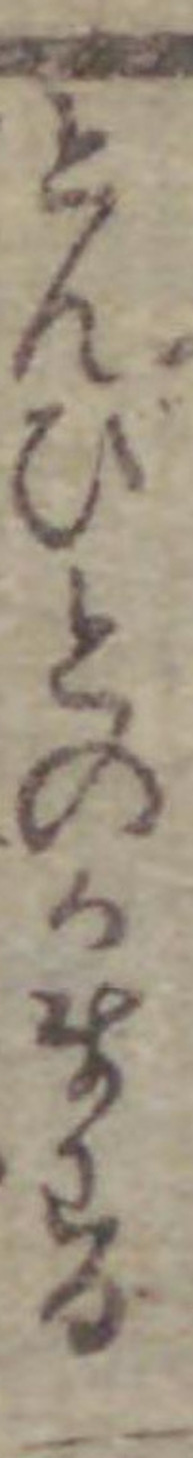とんびとのかまわる
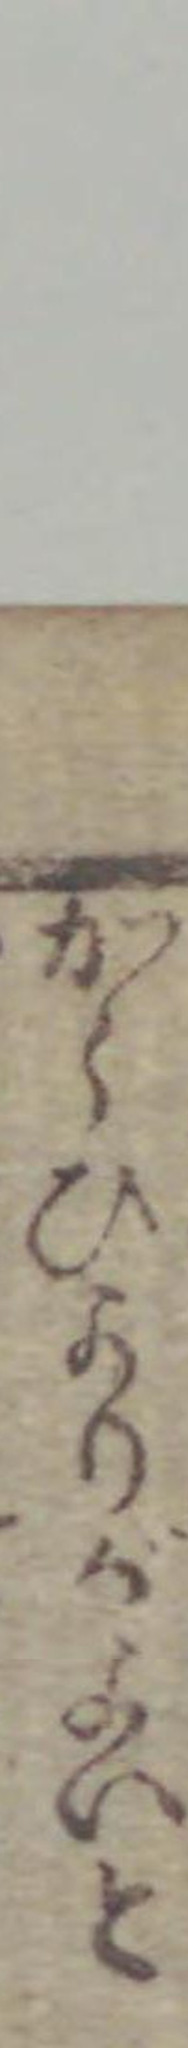からひよりがよいと
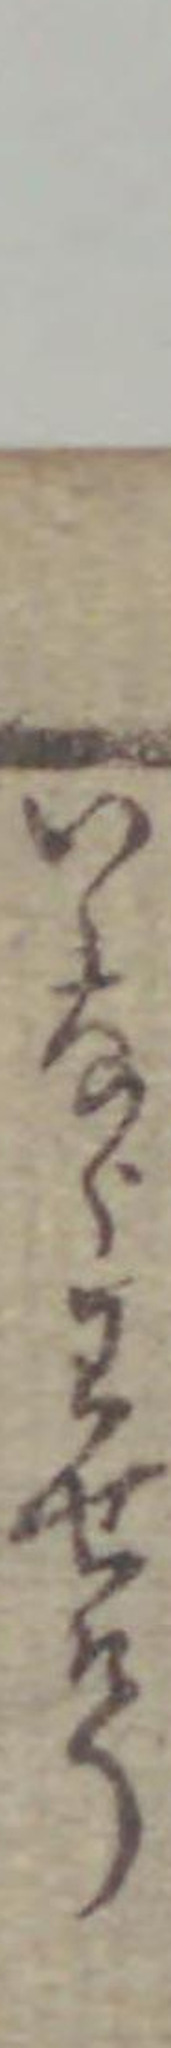いゝならわせけり
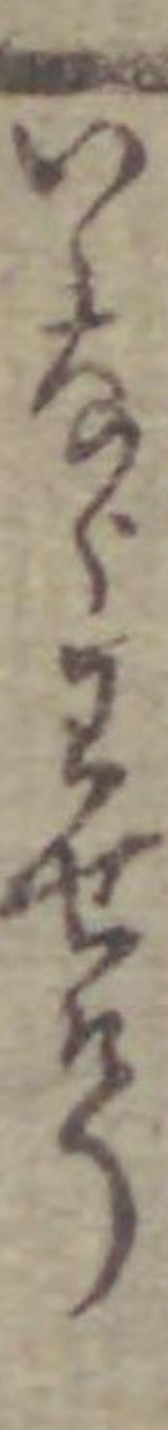いゝならわせけり
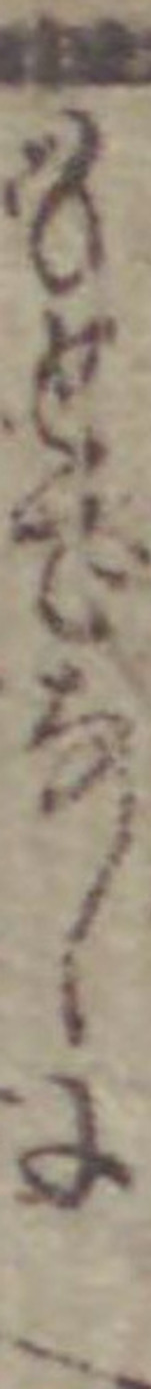もとでなしに
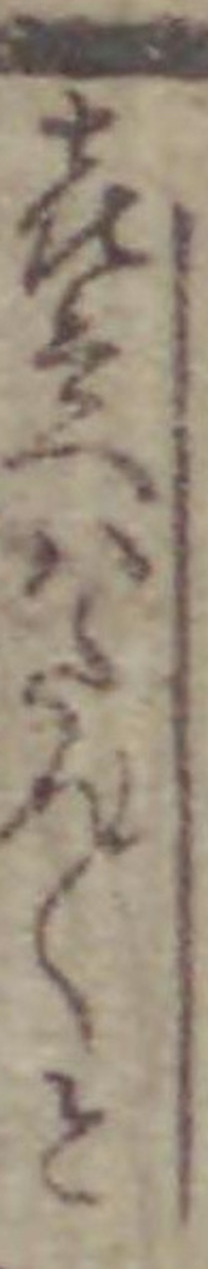喜兵へはたん〳〵と
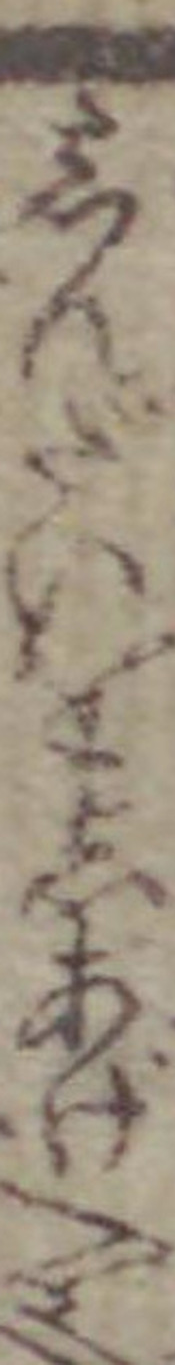しんだいをしあげ
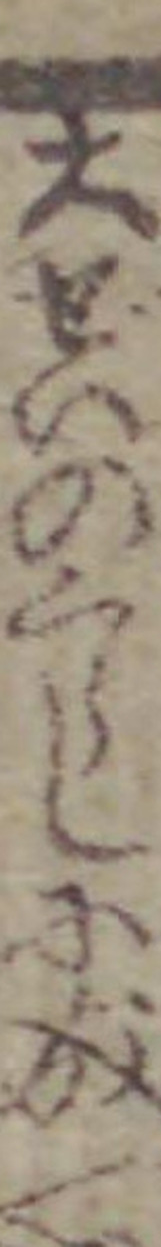大ぜいのくらしに成
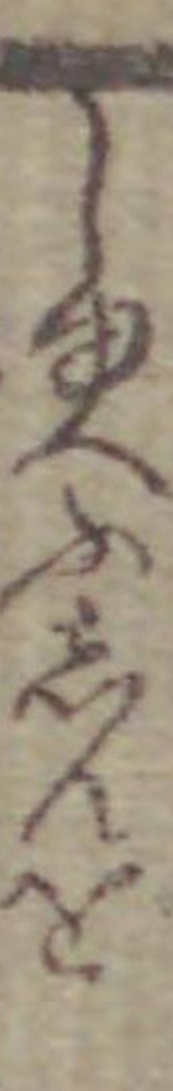しゆへにふしんを
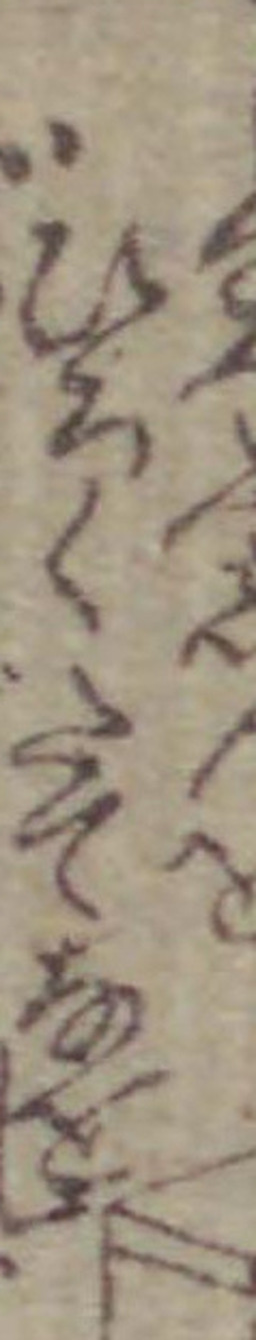ひろくたてなをし
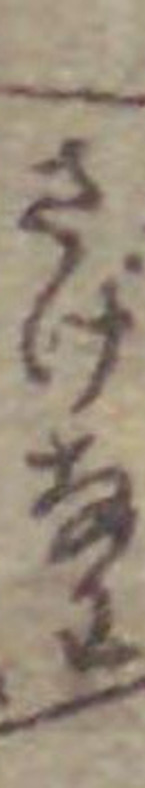さげなわ
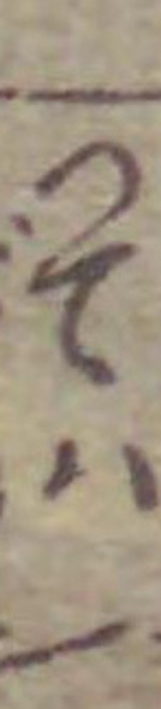つては
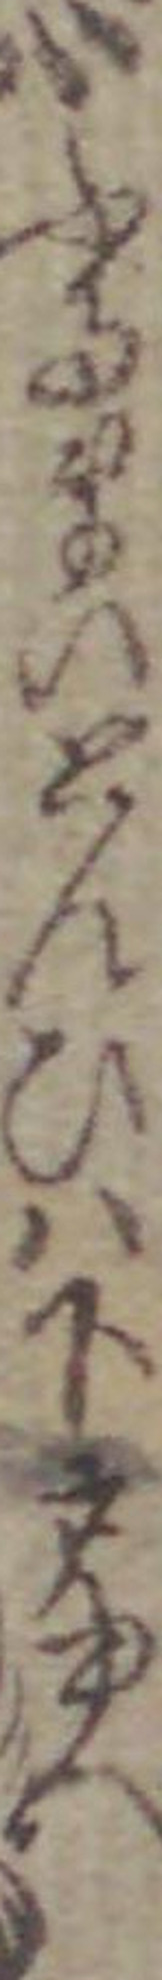ふるまいとんひは下戸ゆへ
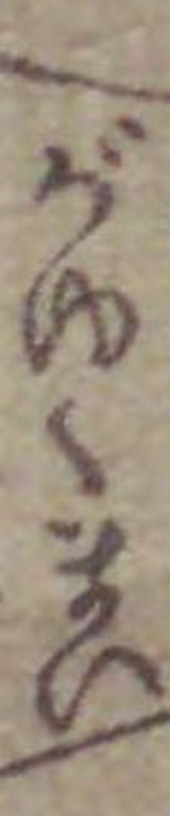がゆくまい
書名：親父布子鳶握 3巻
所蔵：国立国会図書館 National Diet Library, JAPAN
